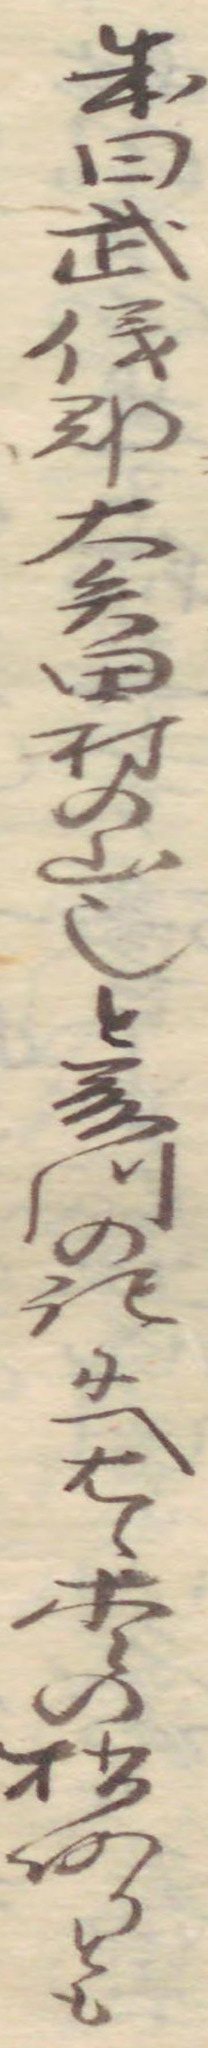或曰武儀郡大矢田村の山也と藤川の記に〽はゝ木〻の梢ありとも
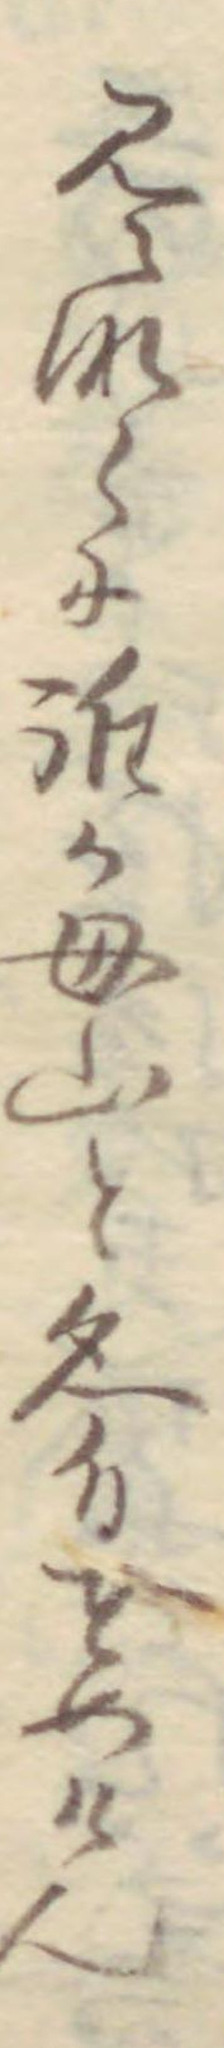見えなくに誰か母山と名付そめけん
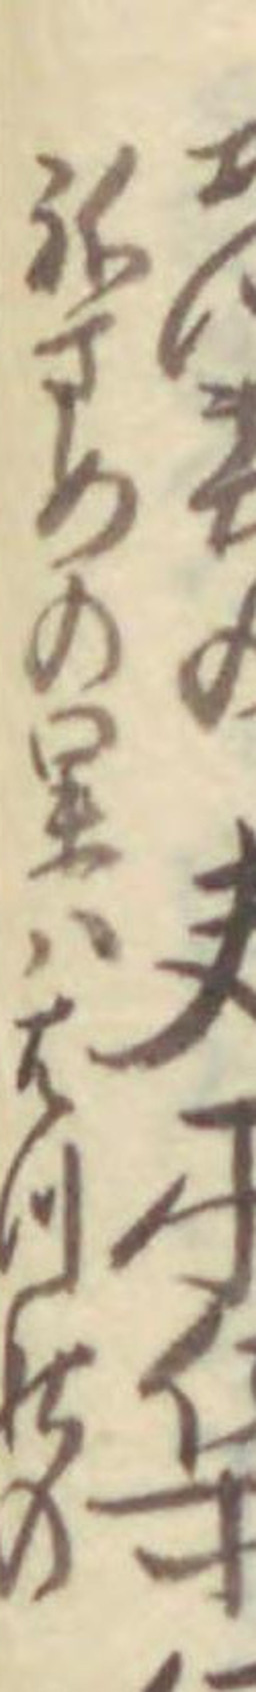ねさめの里ははつ秋の
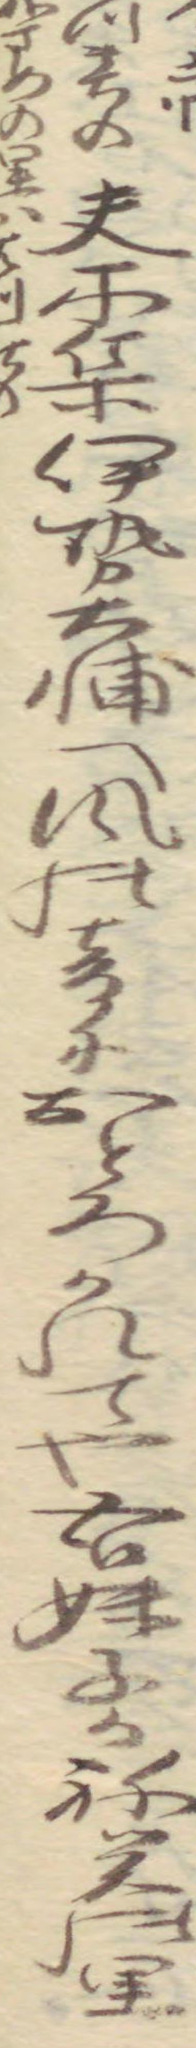夫木集伊勢大輔〽風の音におとろかれてや吾妹子かね覚の里
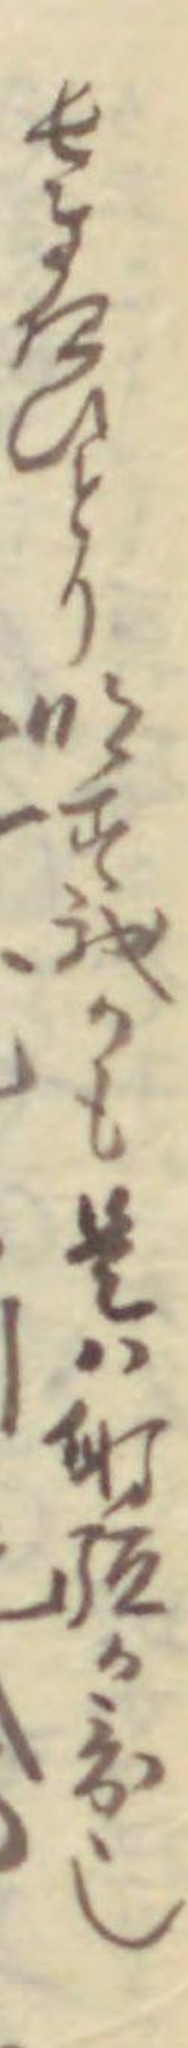長き夜ひとり明す我かも是は躬恒か歌也
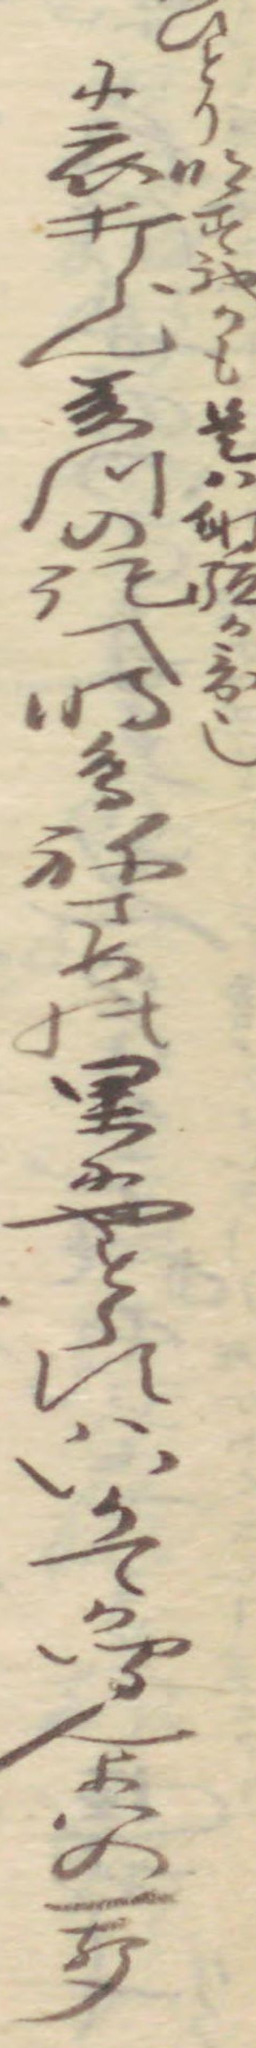に衣打らん藤川の記〽時鳥ねさめの里にやとらすはいかてか聞人よいの一声
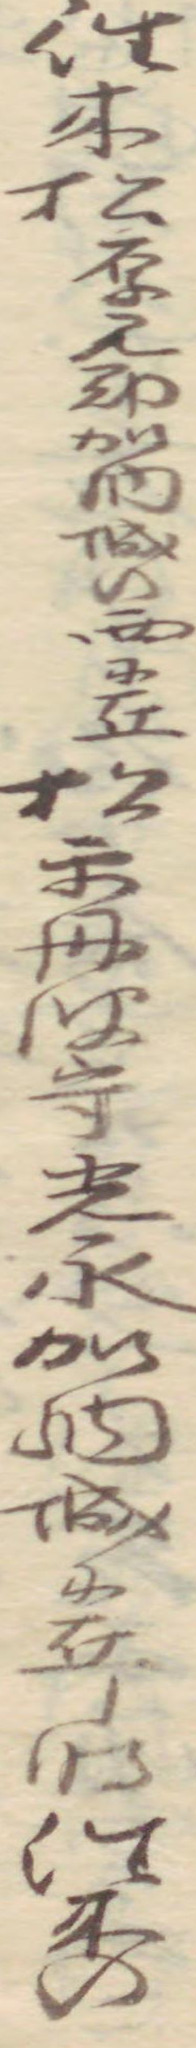往来松厚見郡加納城の西に在松平丹波守光永加納城に在し時往来の
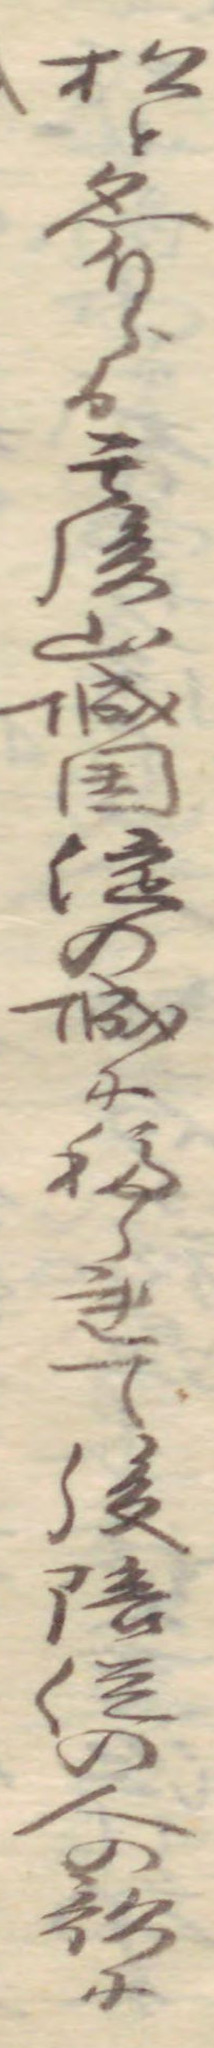松と名付らる其後山城国淀の城に移られて後陪従の人の歌に
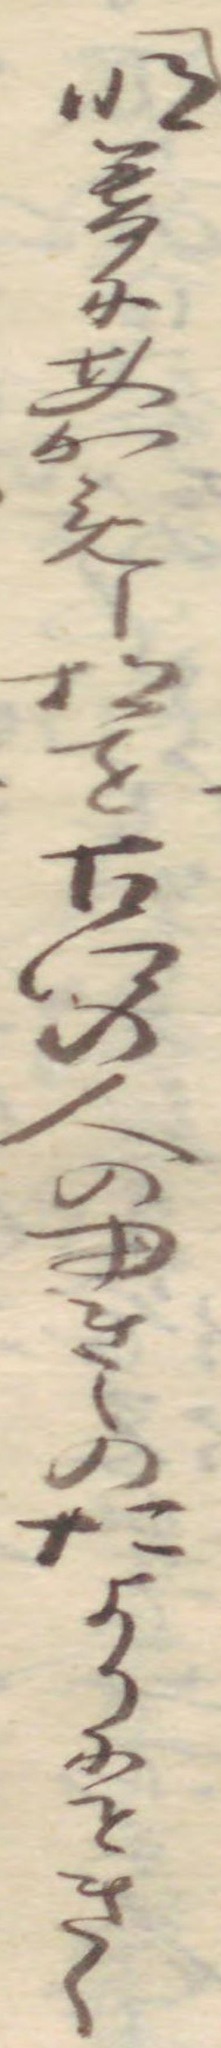〽明暮になかめし松を古郷の人のゆきしのたよりにそきく
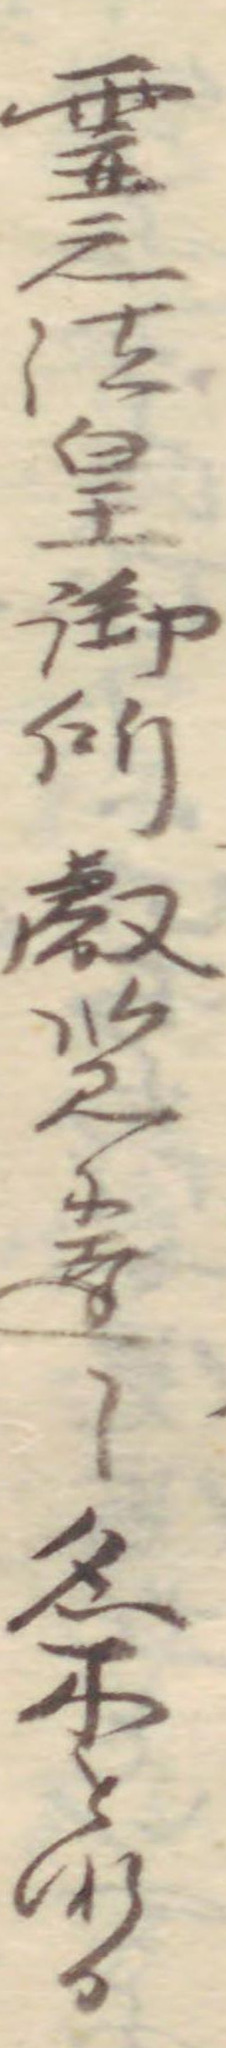霊元法皇御所叡覧に逢し名木となる
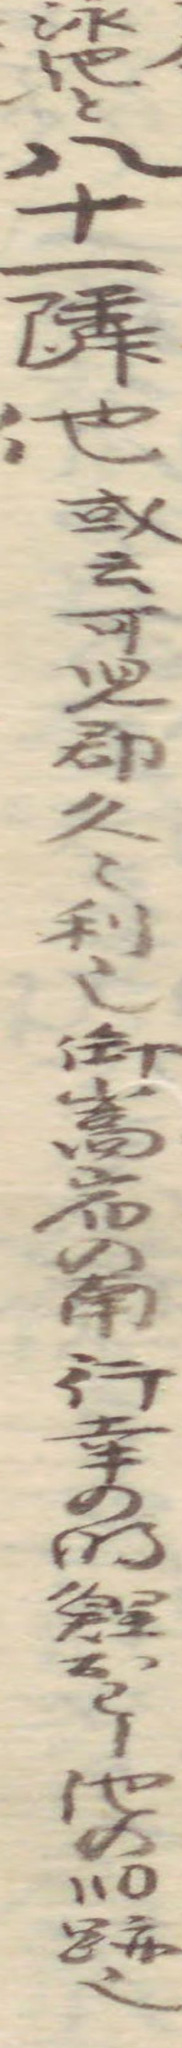八十一隣他或云可児郡久〻利也御嵩宿の南行幸の時鯉おわし池の旧跡也
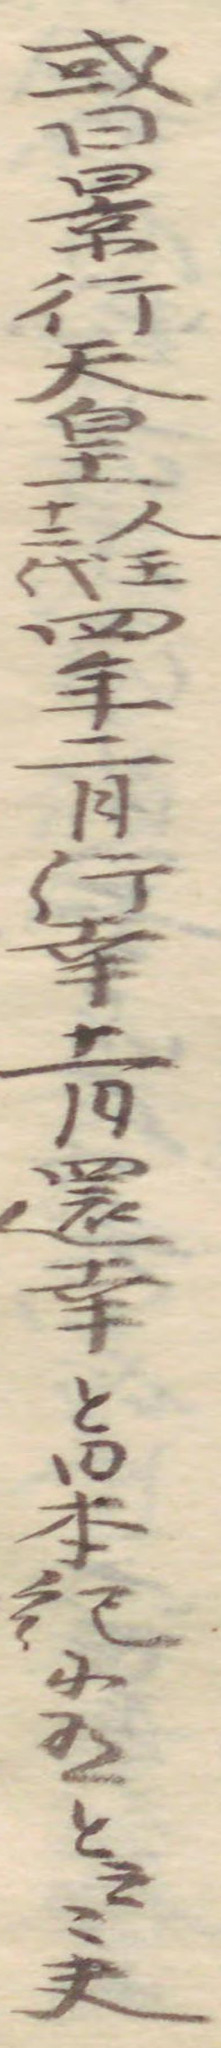或曰景行天皇人王十二代四年二月行幸十一月還幸と日本記に有と云〻夫
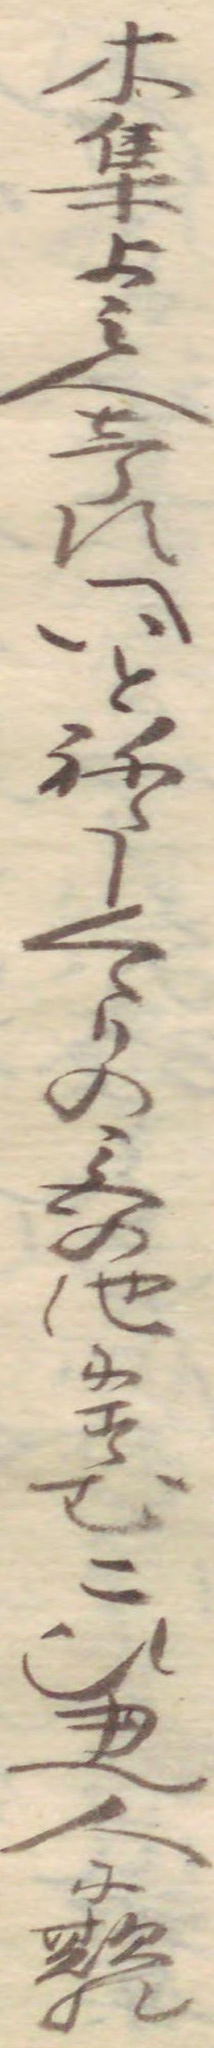木集よみ人しらす〽いとねたしくゝりの宮の池にすむこひゆへ人に欺れ
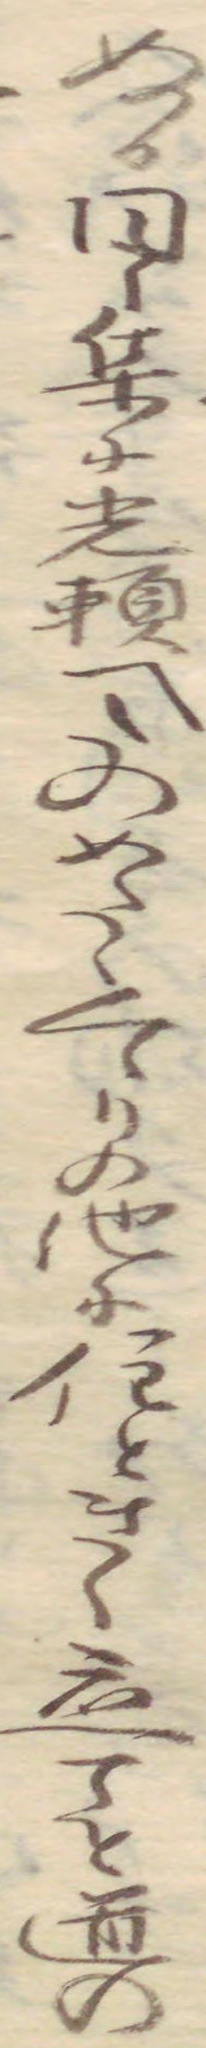ぬる同く集に光頼〽たのめたゝくゝりの池に住ときく恋こそ道の
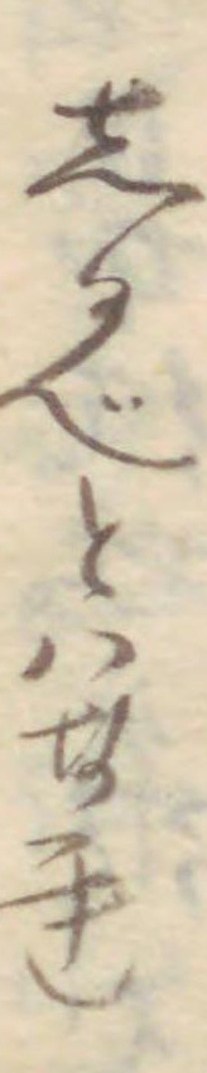しるべとはなれ

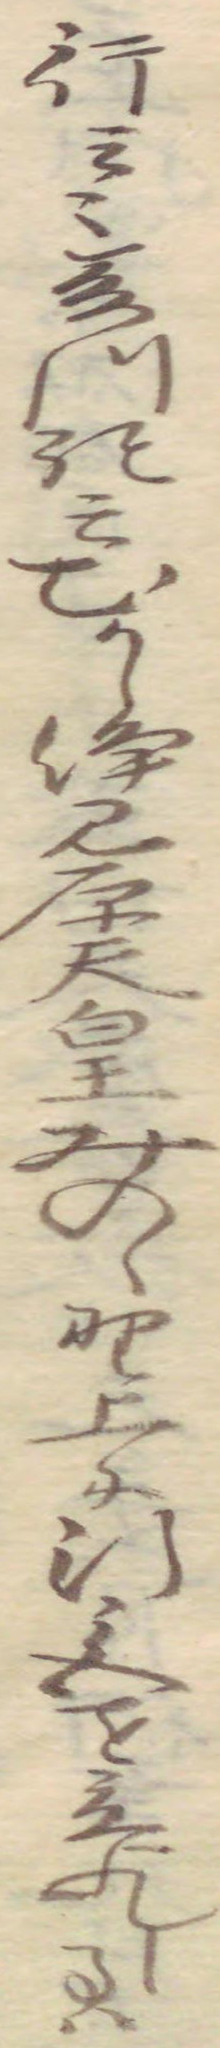行云〻藤川記云むかし浄見原天皇みのゝ野上に行宮を立られし事は
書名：鶯宿雑記. 巻263-264
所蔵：国立国会図書館 National Diet Library, JAPAN
